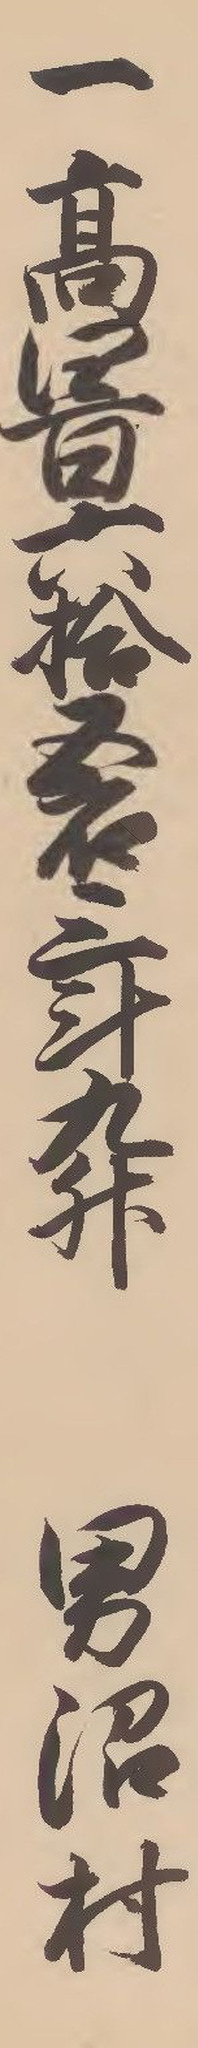一高四百六拾五石三斗九升男沼村

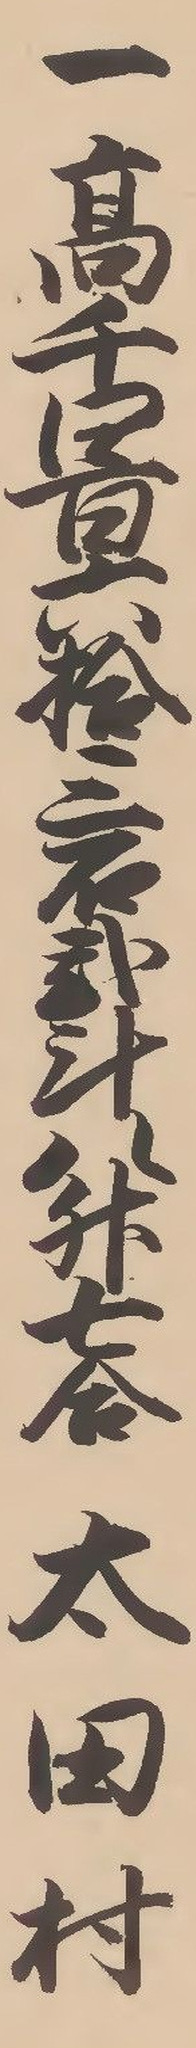一高千四百六拾三石弐斗八升七合太田村
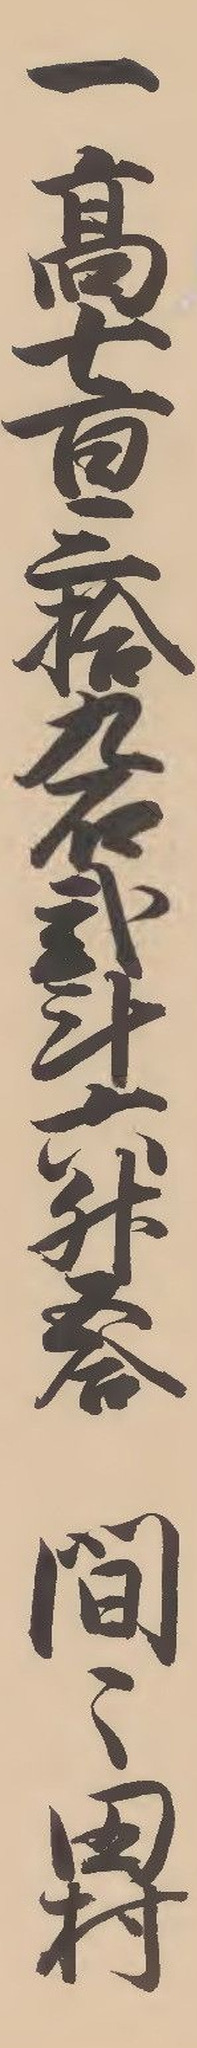一高七百三拾九石弐斗六升五合間々田村
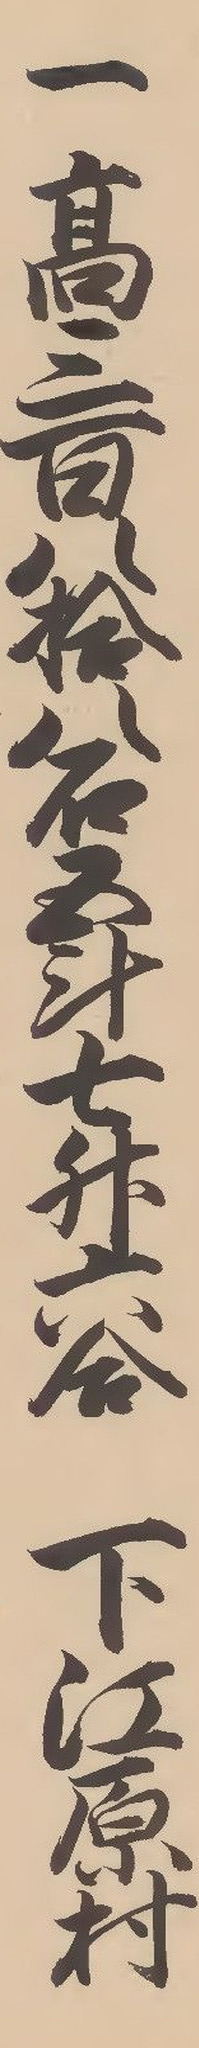一高三百八拾八石五斗七升六合下江原村
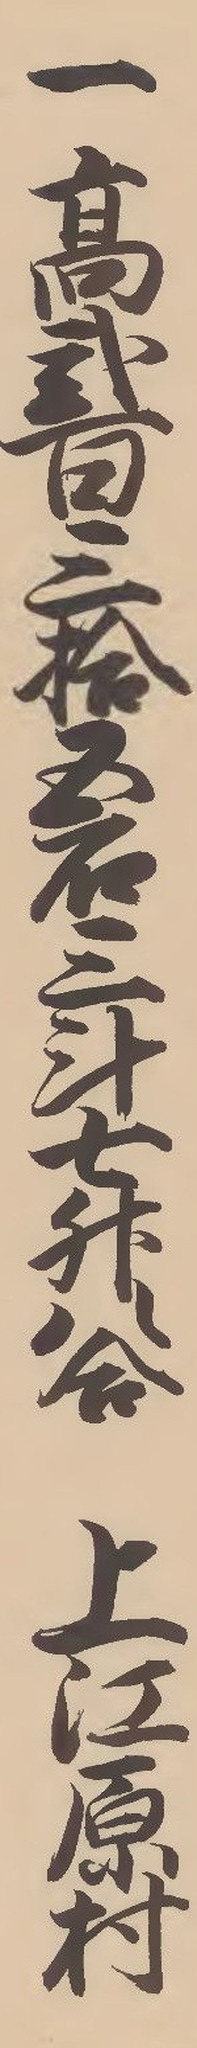一高弐百三拾五石三斗七升八合上江原村
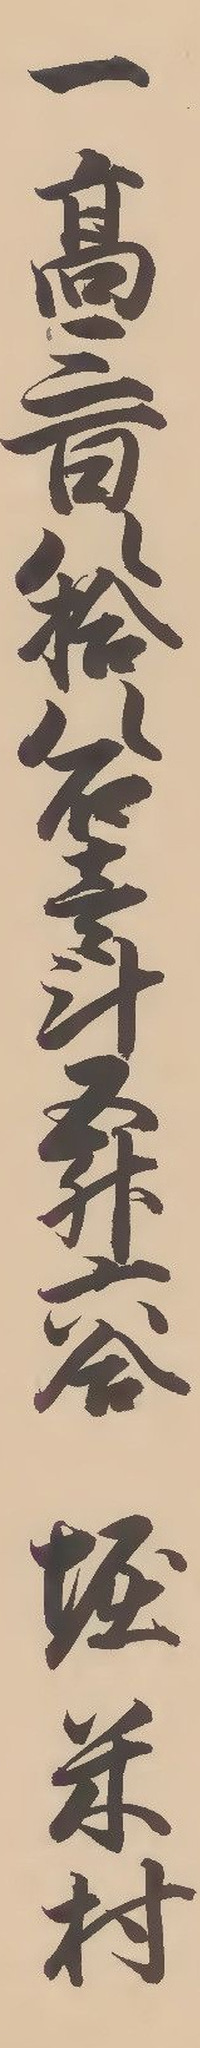一高三百八拾八壱斗五升六合堀米村

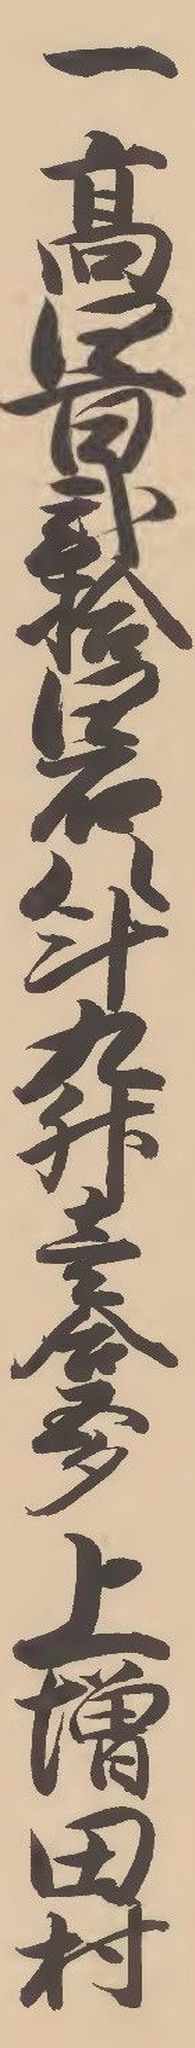一高四百弐拾四石八斗九升壱合五勺上増田村
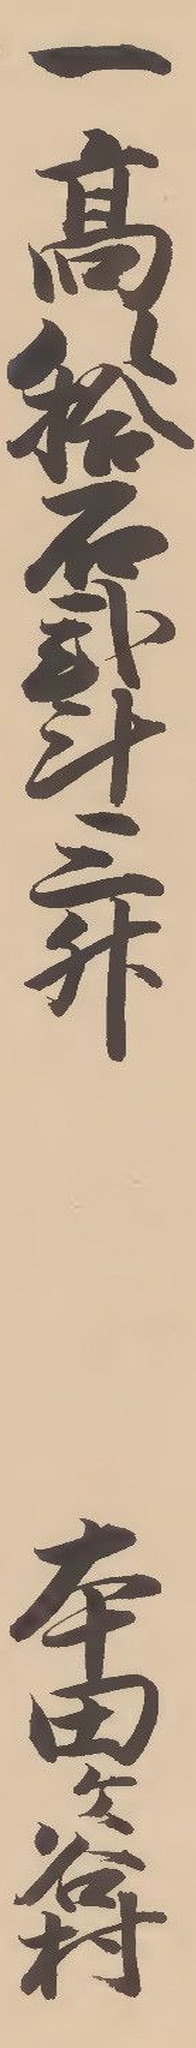一高八拾石弐斗三升本田ヶ谷村
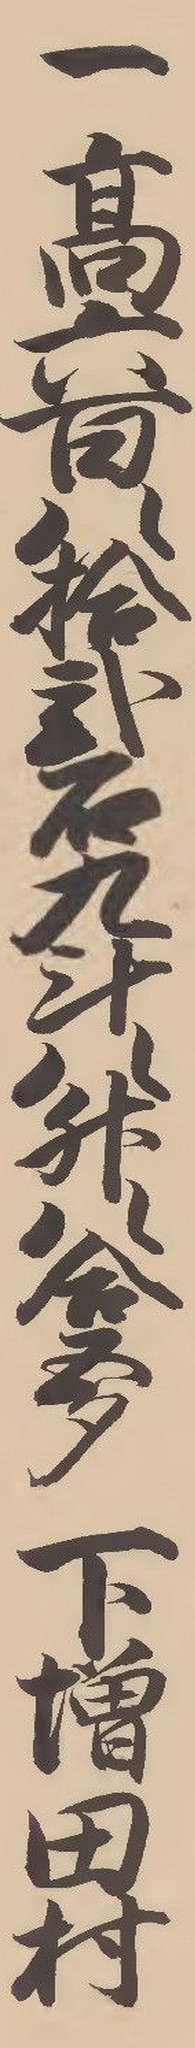一高六百八拾弐石九斗八升八合五勺下増田村
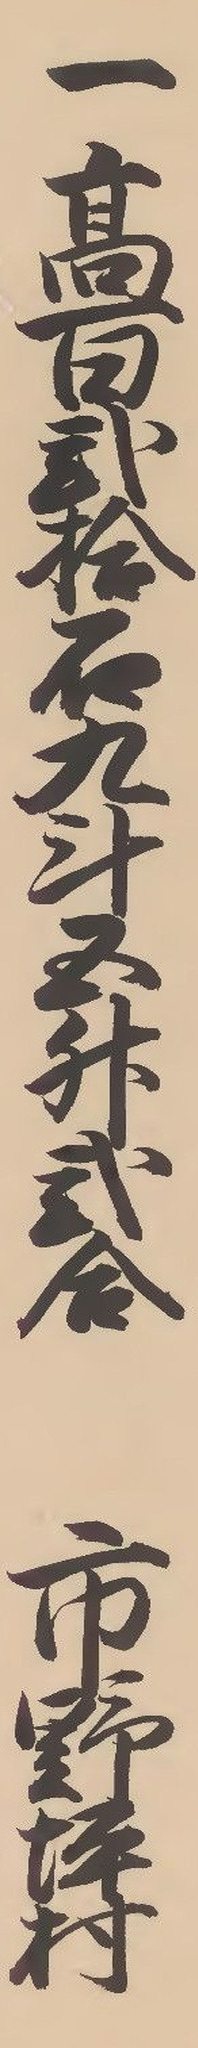一高百弐拾石九斗五升弐合市野坪村
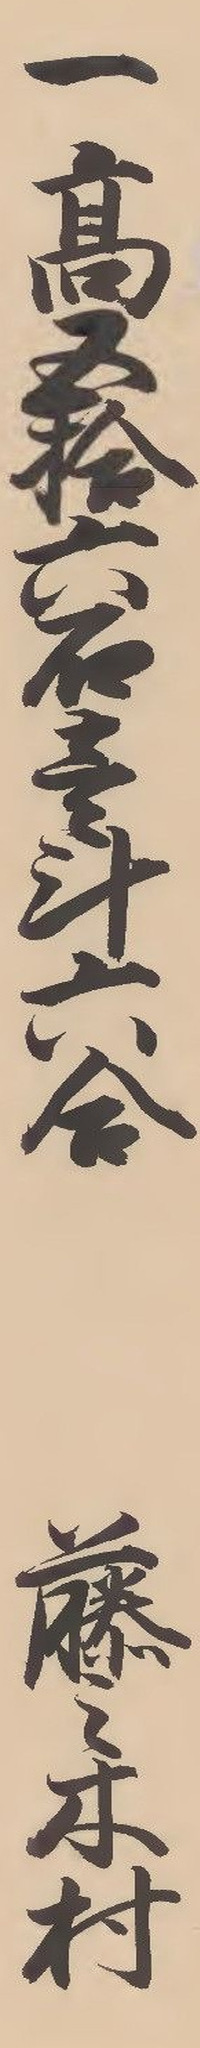一高五拾六石壱斗六合藤之木村
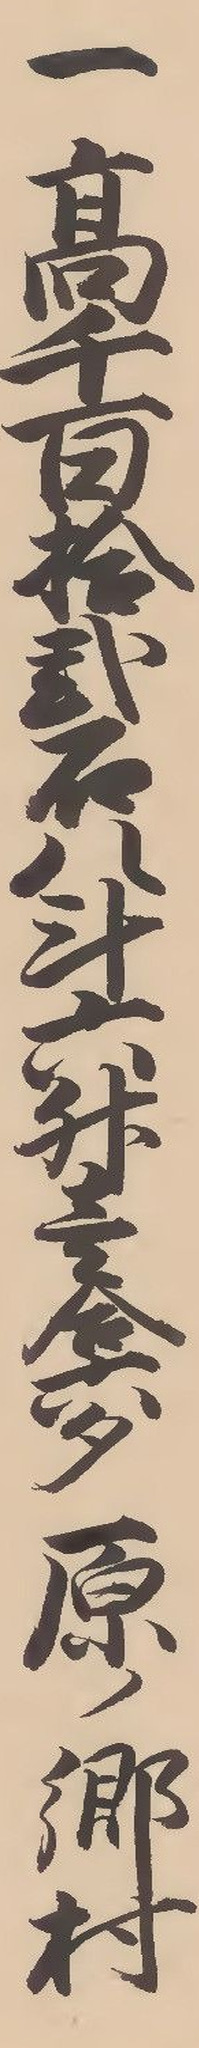一高千百拾弐石八斗六升壱合六勺原ノ郷村
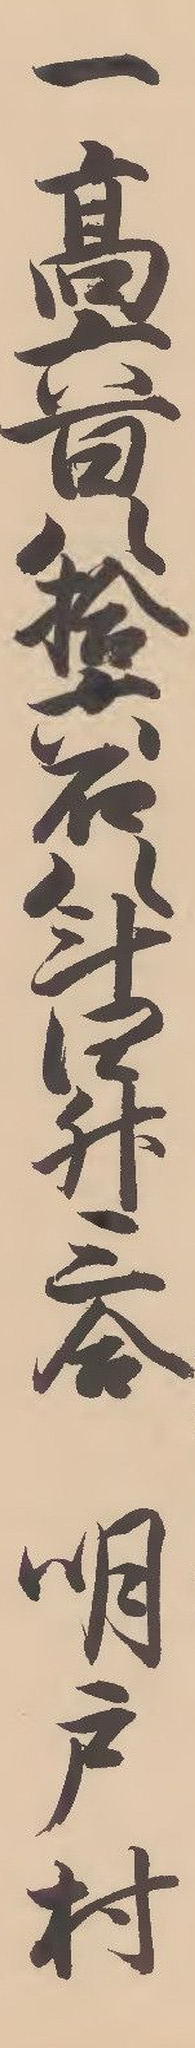一高六百八拾六石八斗四升三合明戸村

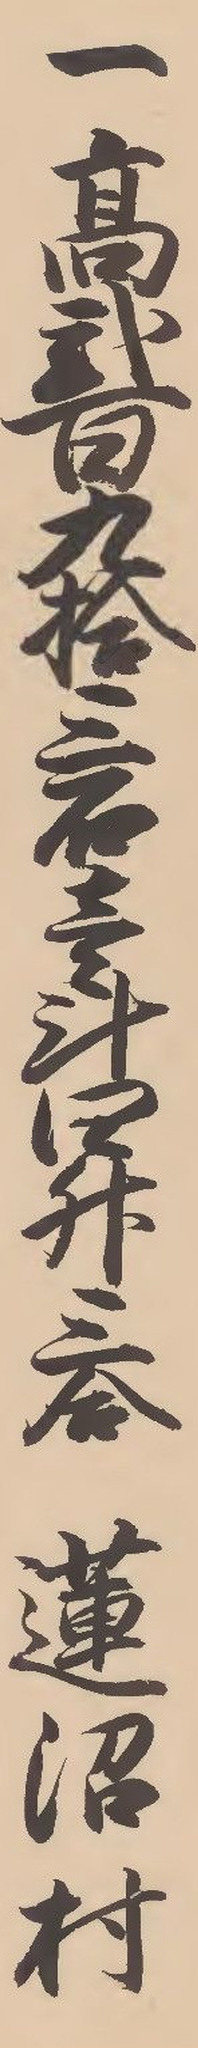一高弐百九拾三石壱斗四升三合蓮沼村
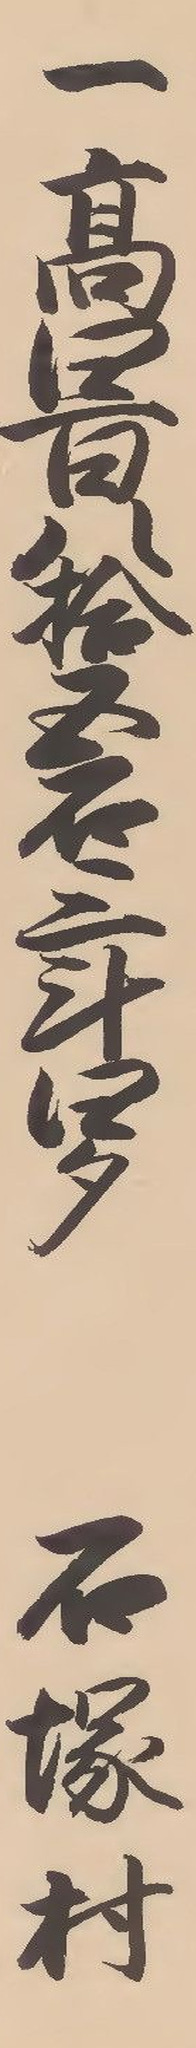一高四百八拾五石三斗四勺石塚村
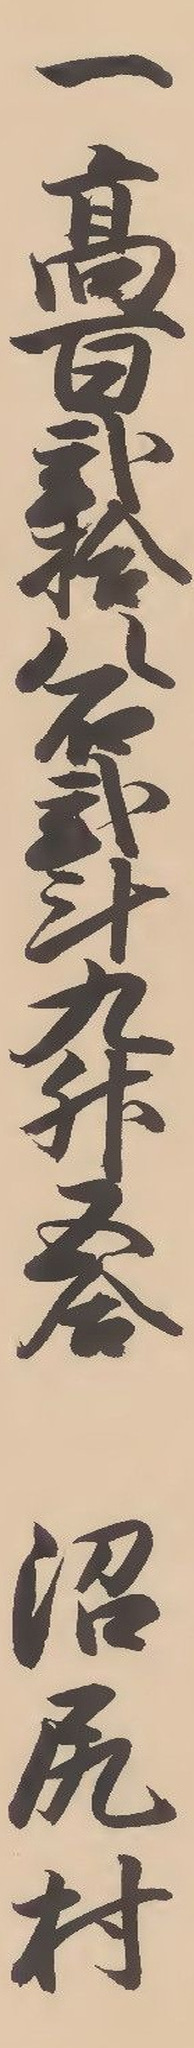一高百弐拾八石弐斗九升五合沼尻村
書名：武蔵国郷帳　下
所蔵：国立公文書館 National Archives of Japan
